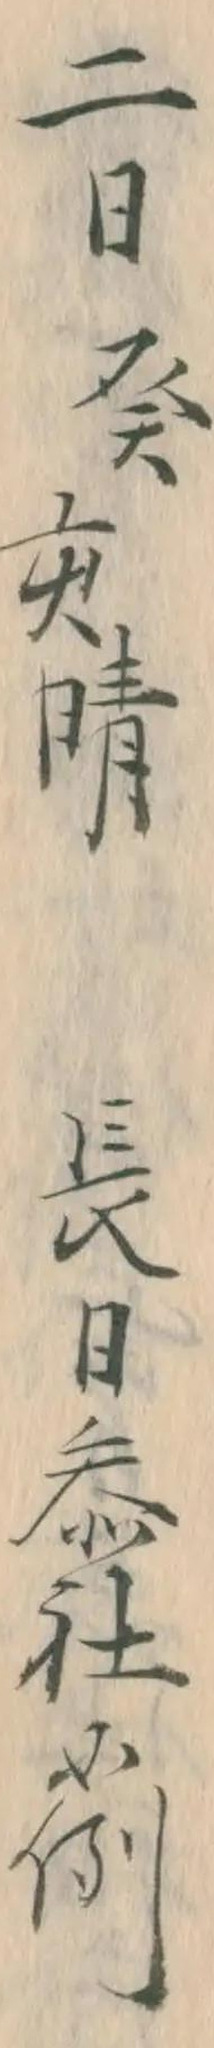二日癸亥晴長日参社如例

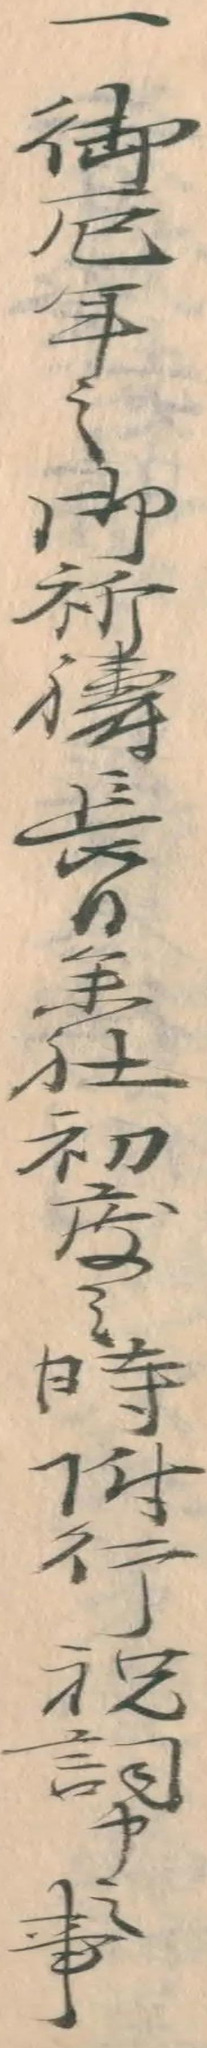一御厄年之御祈祷長日参社初度之時附行祝詞申之事
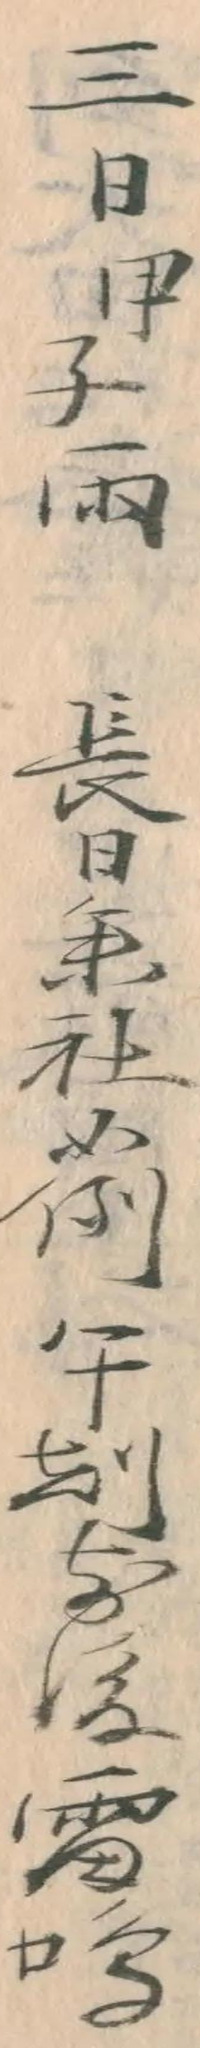三日甲子雨長日参社如例午刻前後雷鳴
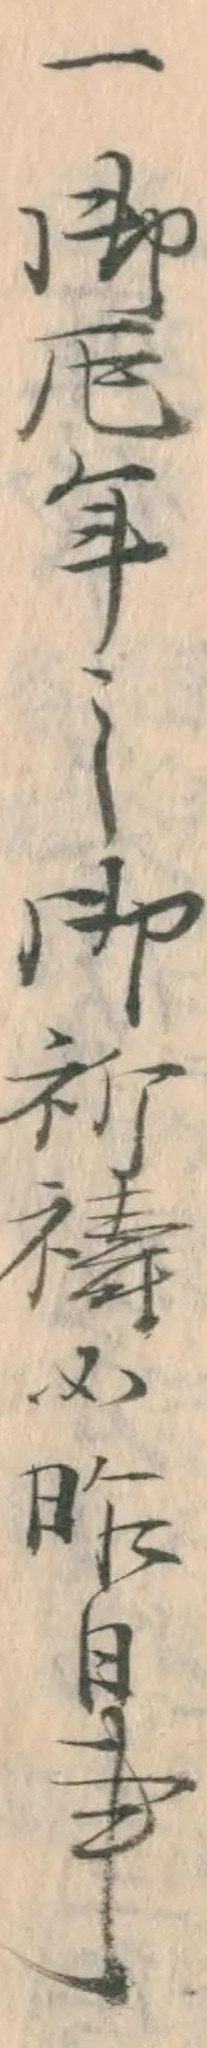一御厄年之御祈祷如昨日事
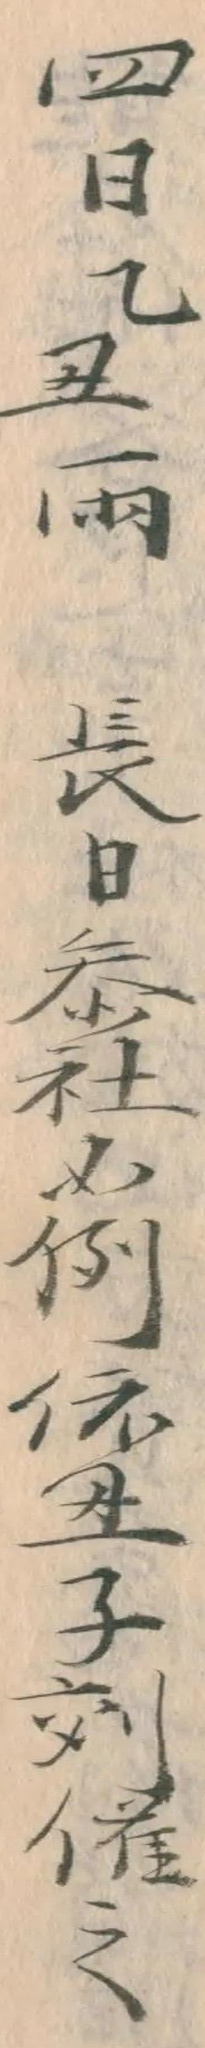四日乙丑雨長日参社如例依丑子刻催之
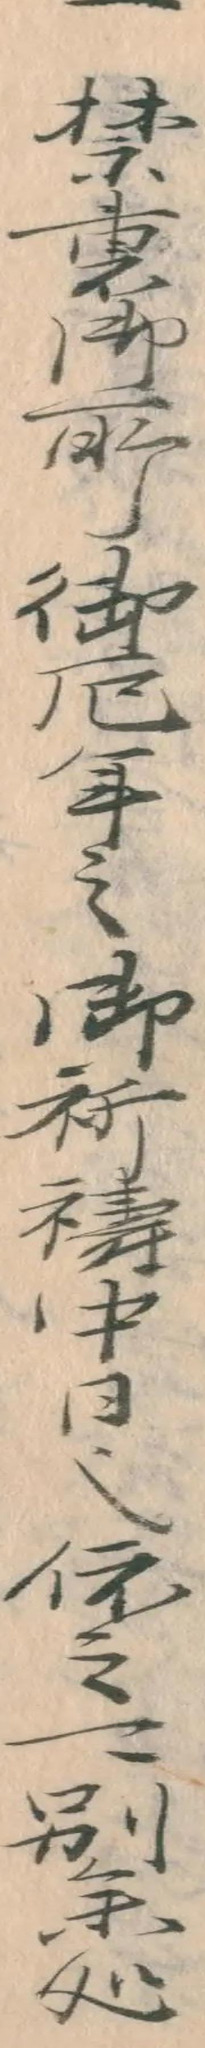一禁裏御所御厄年之御祈祷中日也依之可別参処
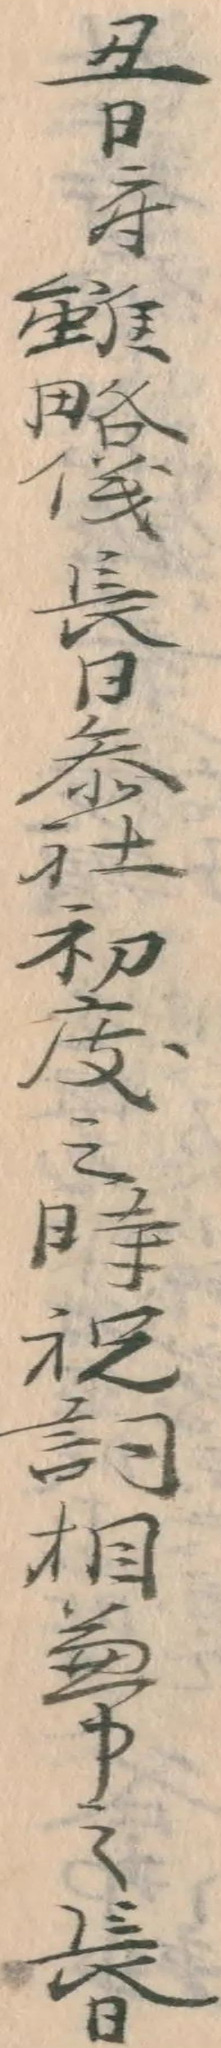丑日ニ付雖略儀長日参社初度之時祝詞相兼申之長日
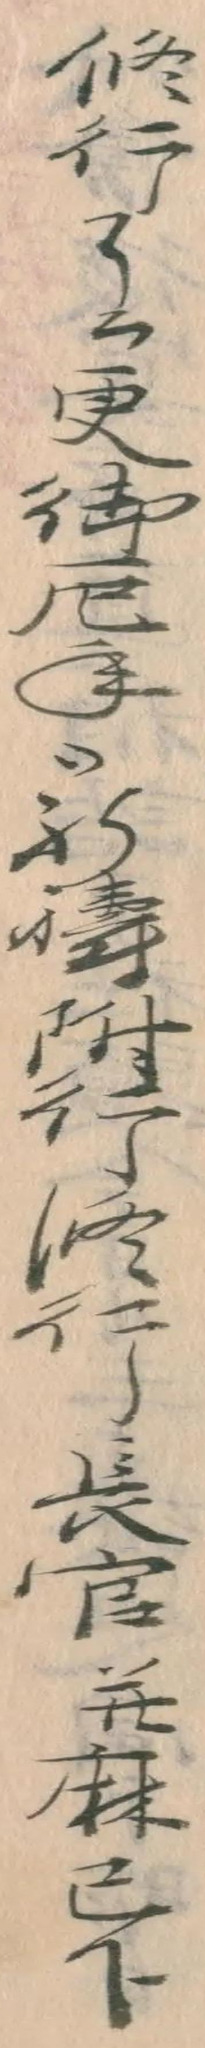修行了而更御厄年御祈祷附行修行長官并麻已下
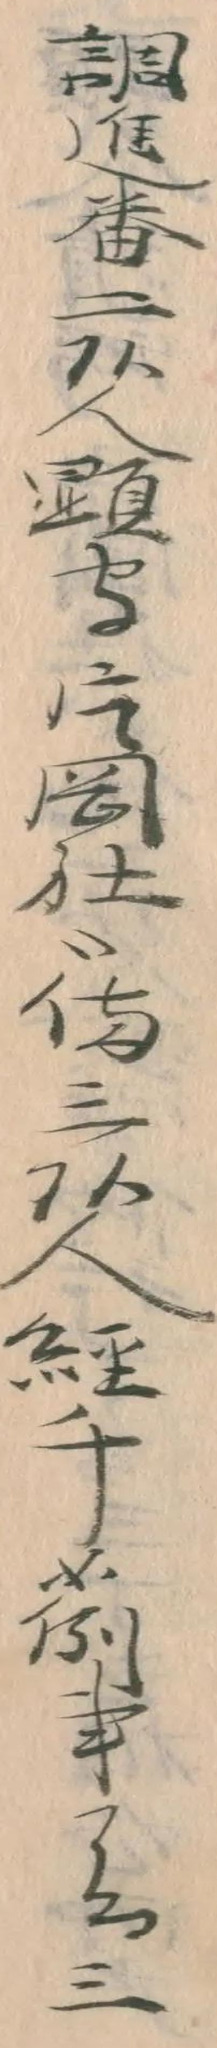調進番二頭人顕守片岡社御備三頭人経千如例事了而三
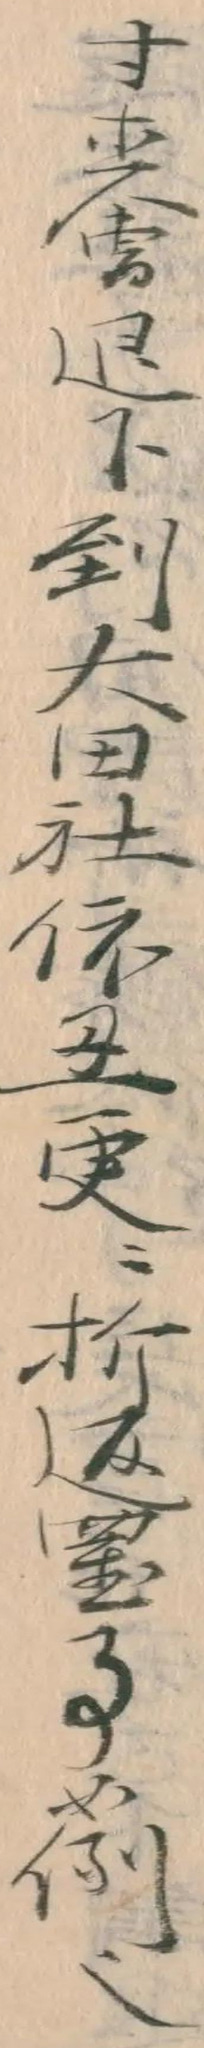寸直會退下到大田社依丑更ニ折返置事如例也
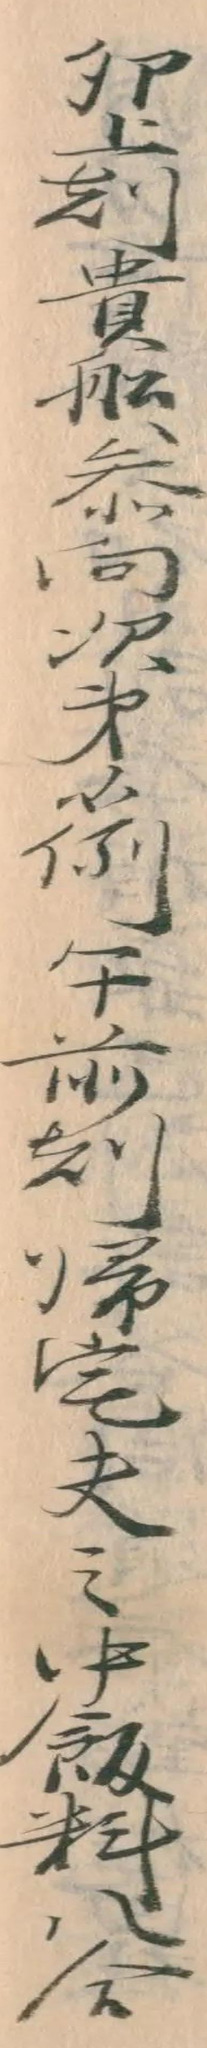一卯上刻貴舩参向次第如例午前刻帰宅夫之中飯料八合
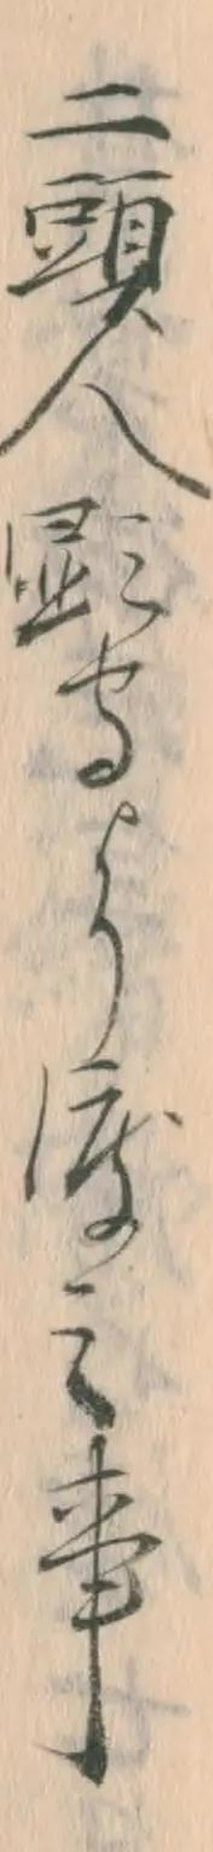二頭人顕守より渡之事
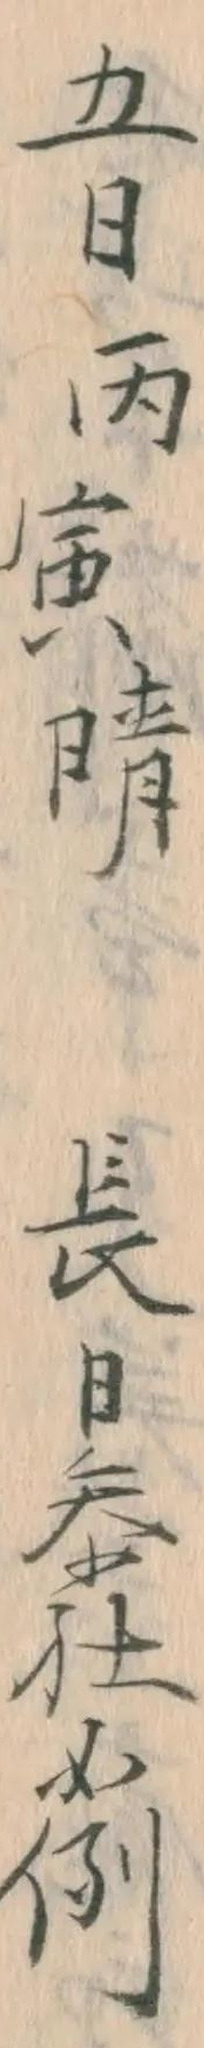五日丙寅晴長日参社如例
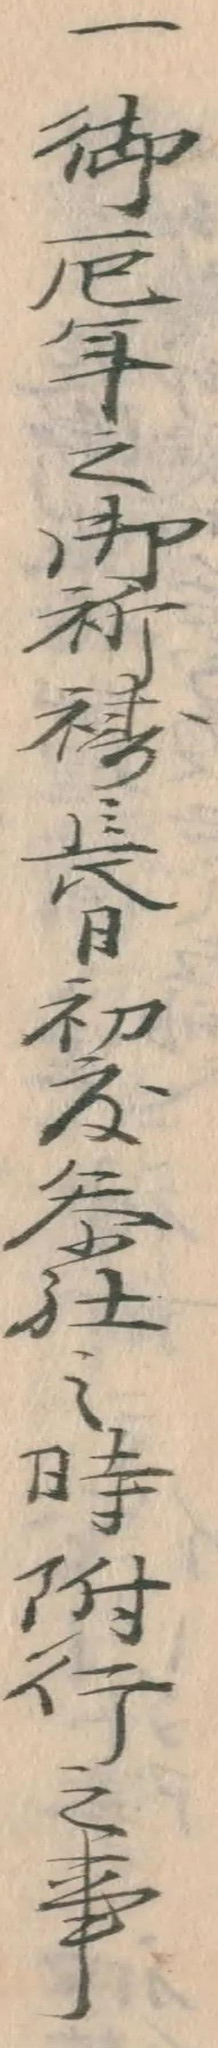一御厄年之御祈祷長日初度参社之時附行之事
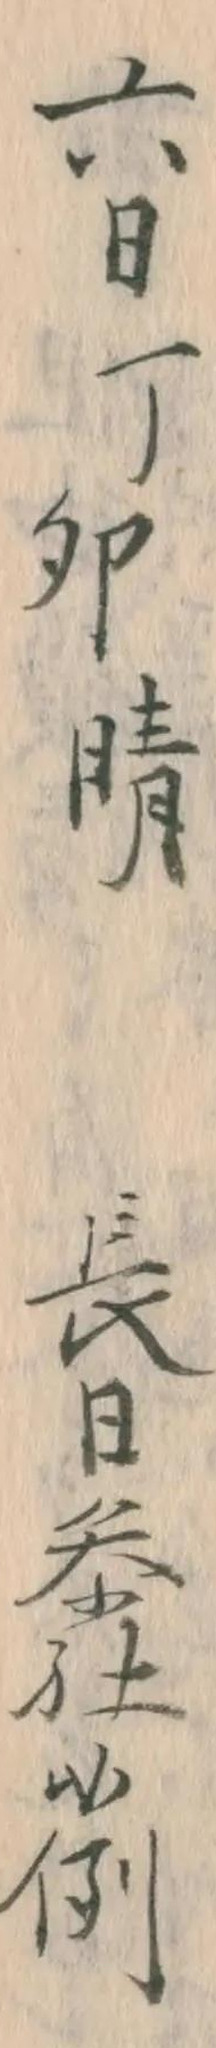六日丁卯晴長日参社如例
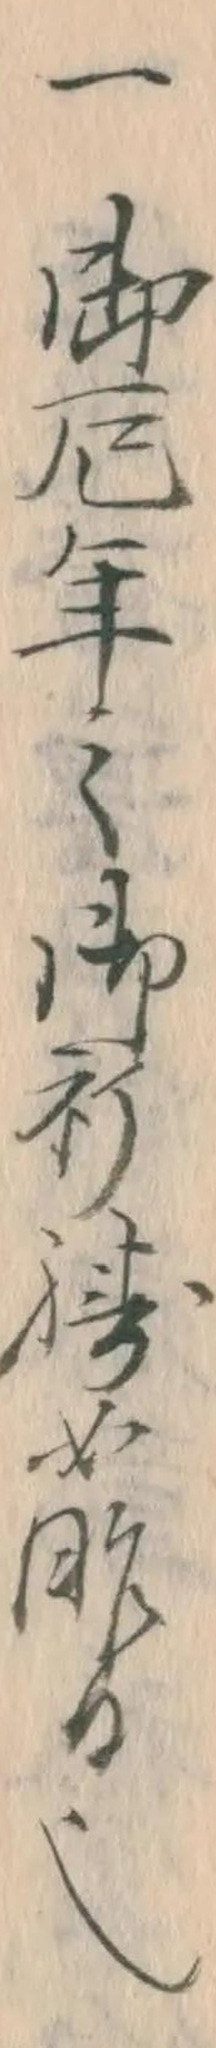一御厄年之御祈祷如昨日也
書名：賀茂社記録. 第73冊
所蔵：国立国会図書館 National Diet Library, JAPAN
